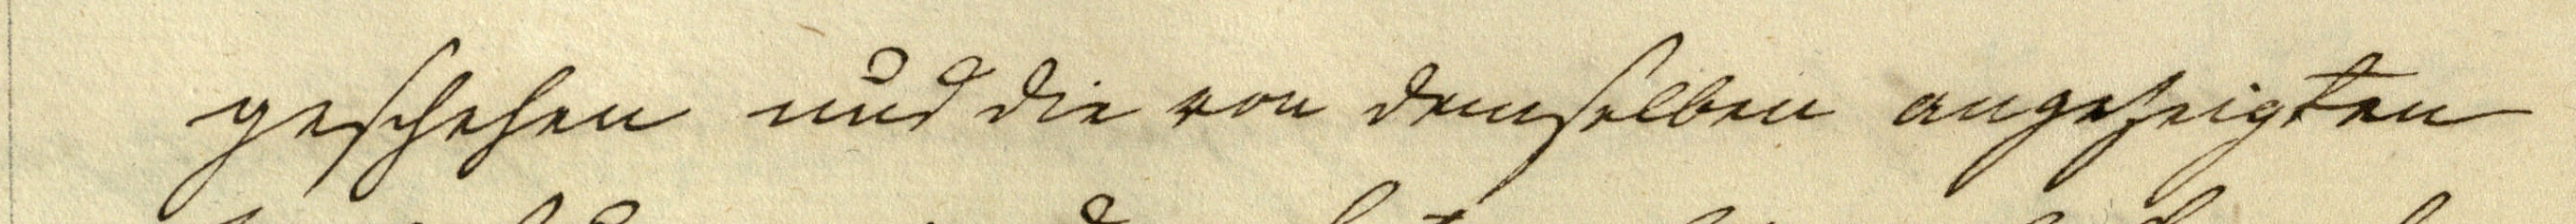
geschehen und die von demselben angezeigten
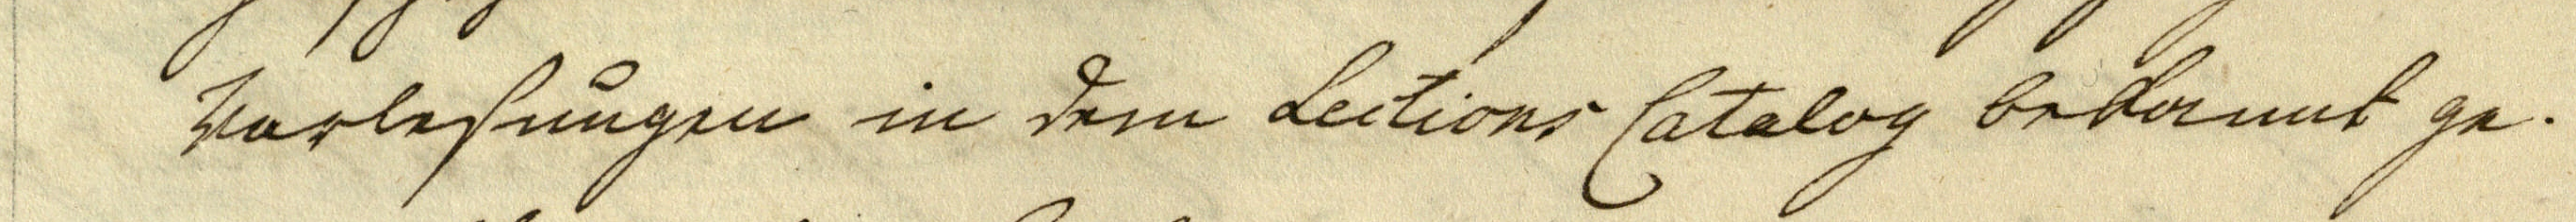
Vorlesungen in dem Lections Catalog bekannt ge-
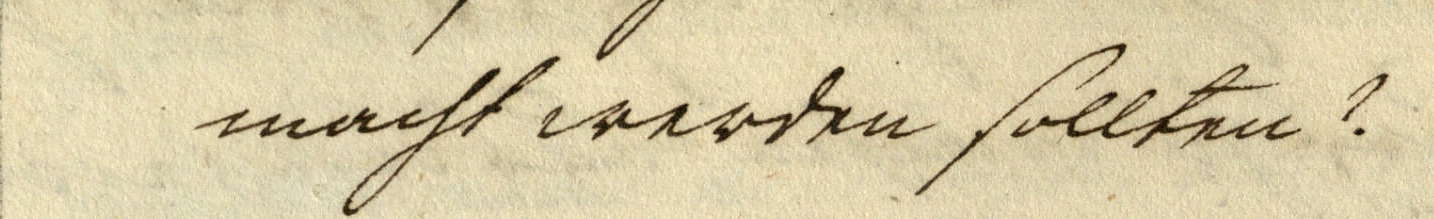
macht werden sollten?
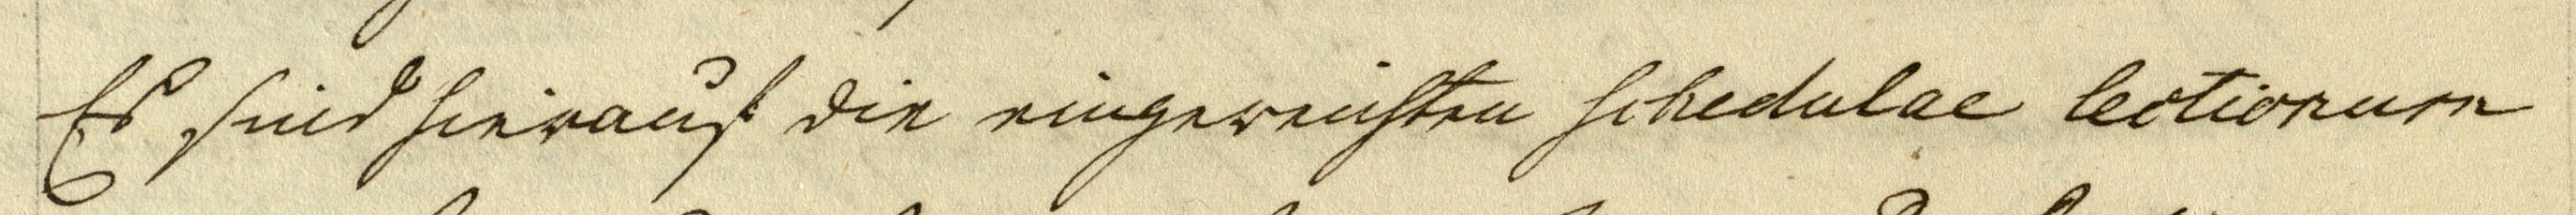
Es sind hierauf die eingereichten schedulae lectionum
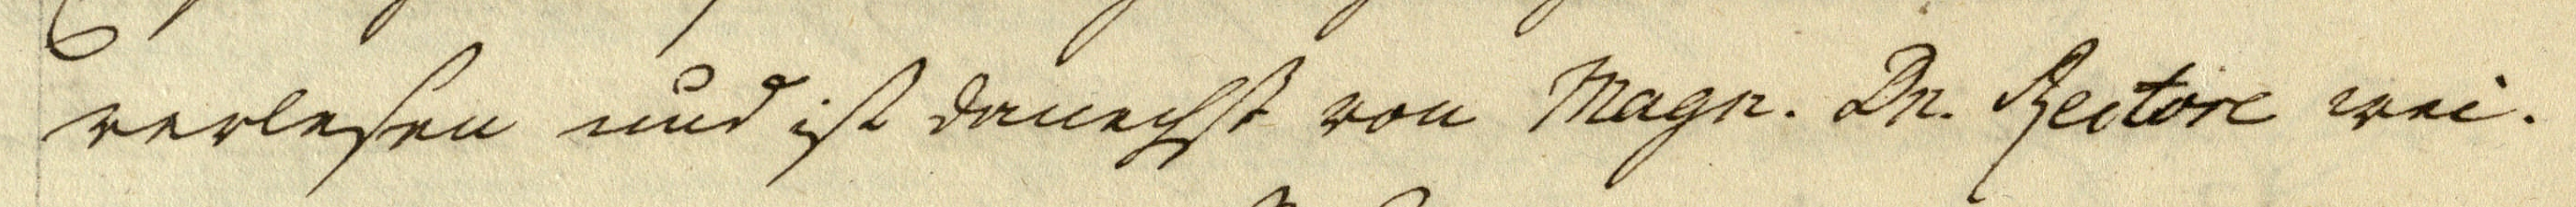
verlesen und ist danechst von Magn. Dn. Rector wei-
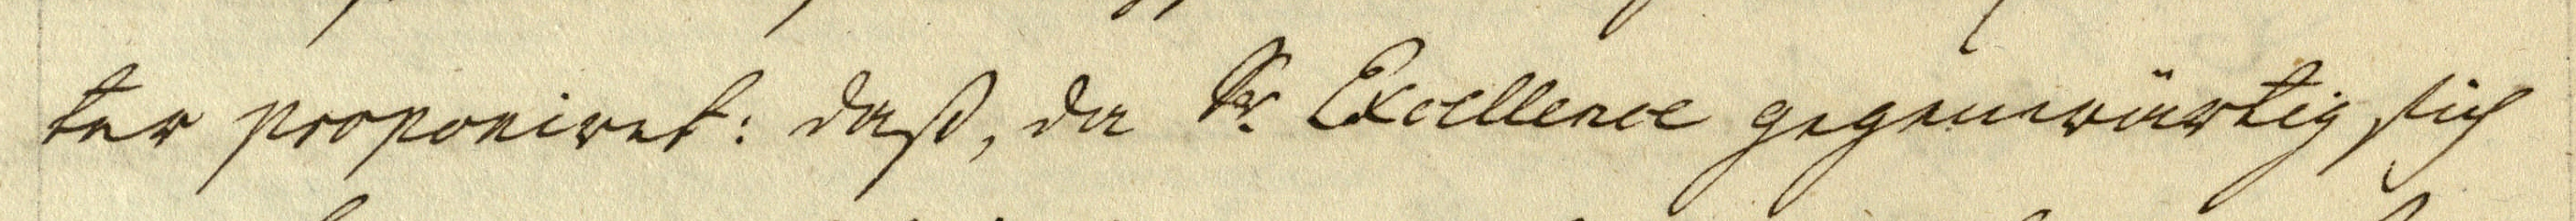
ter proponiret: daß, da Sr. Excellence gegenwärtig sich
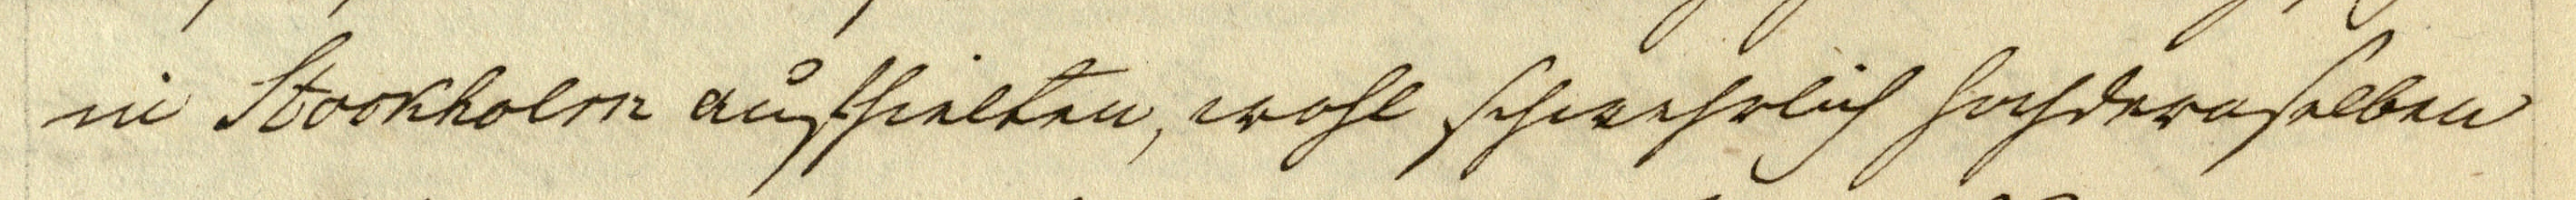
in Stockholm aufhielten, wohl schwehrlich hochderoselben
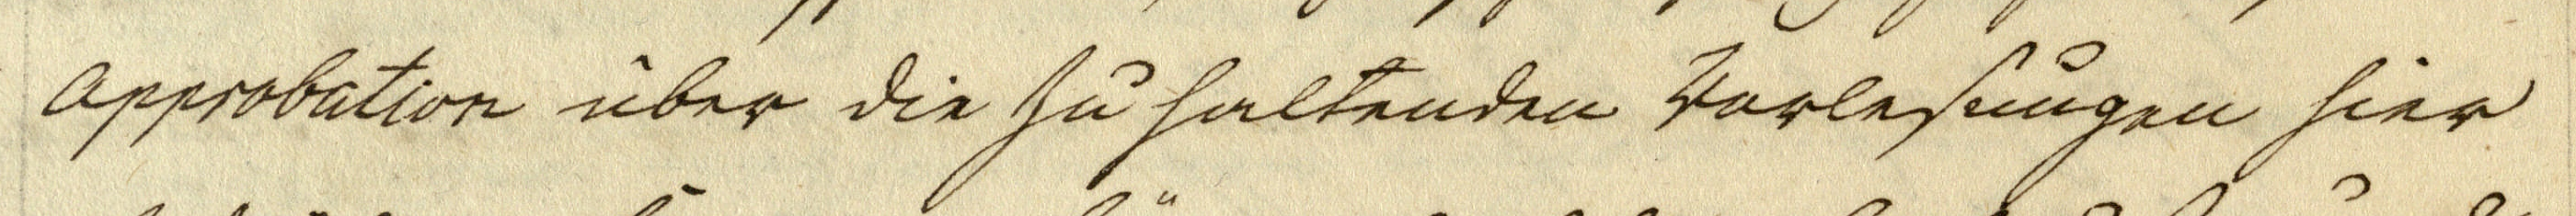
Approbation über die zu haltenden Vorlesungen hier
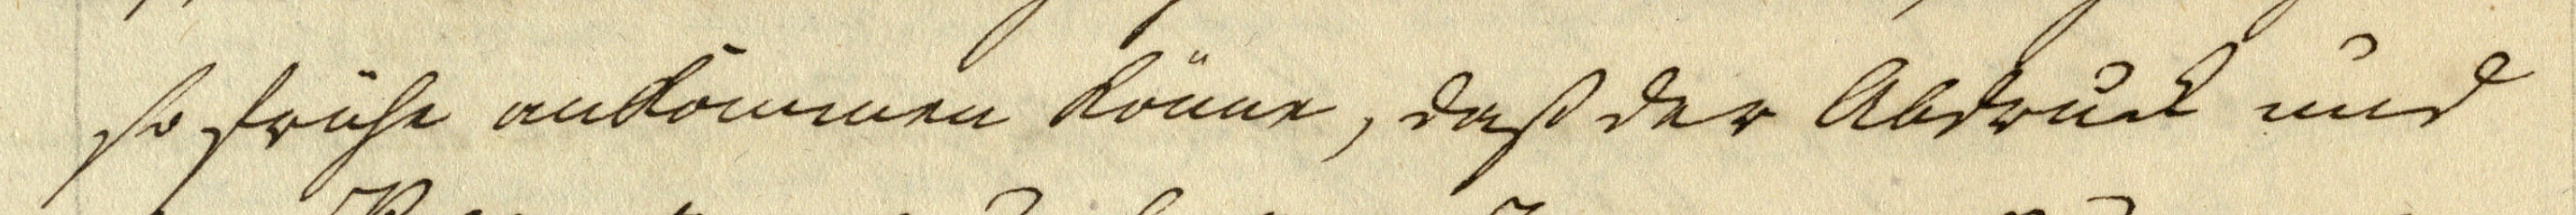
so frühe ankommen könne, daß der Abdruck und
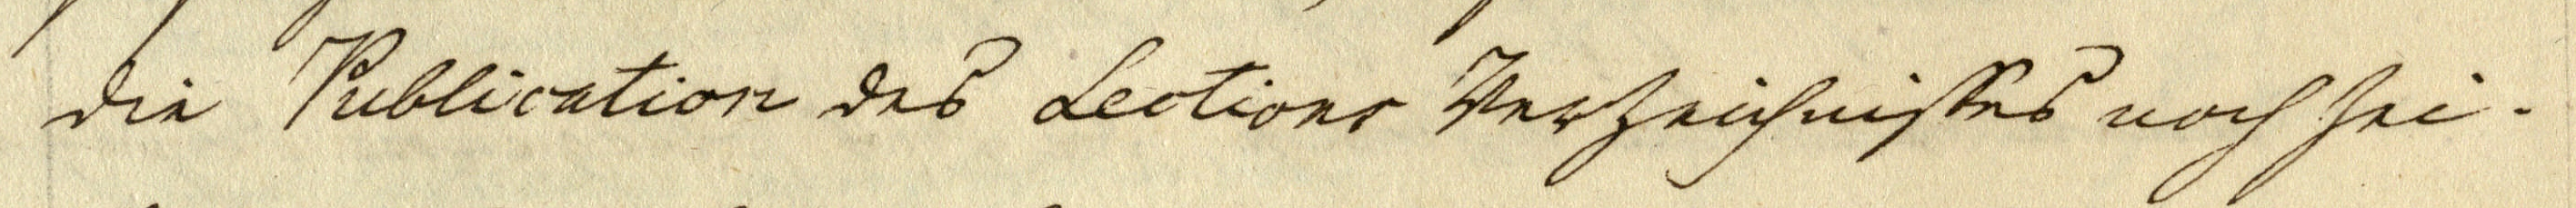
die Publication des Lections Verzeichnisses noch zei-
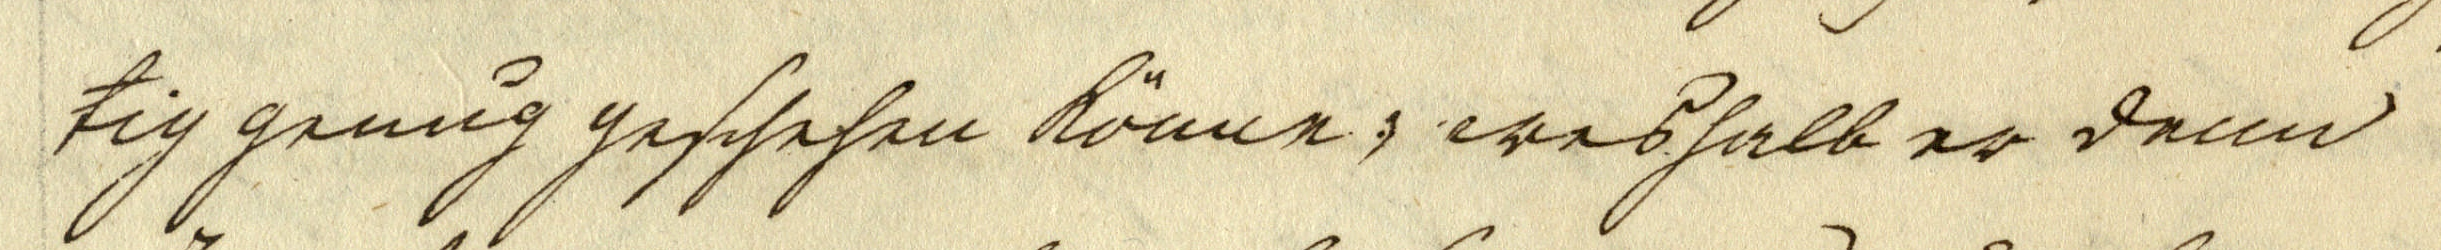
tig genug geschehen könne, weshalb er denn
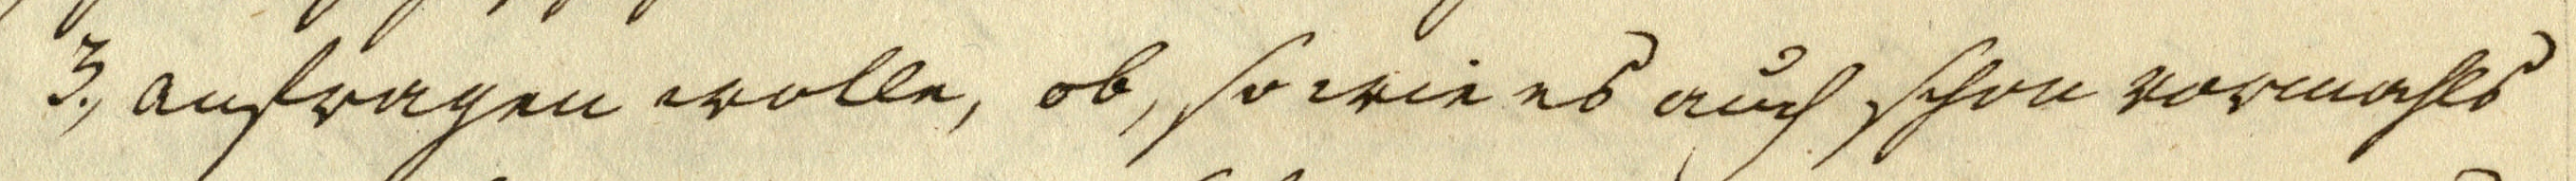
3., anfragen wolle, ob, so wie es auch schon vormahls
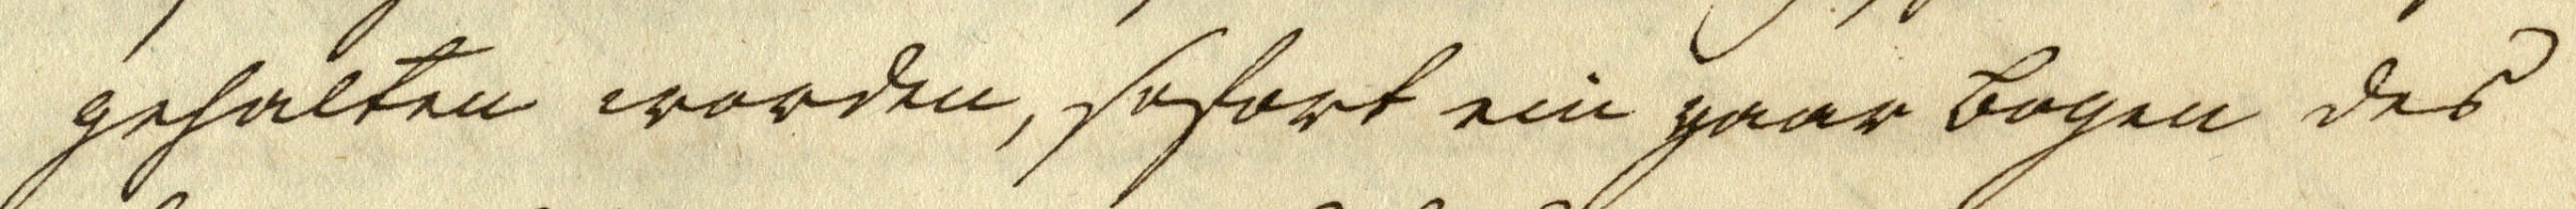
gehalten worden, sofort ein paar Bogen des
